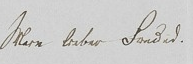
Mein lieber Freund.
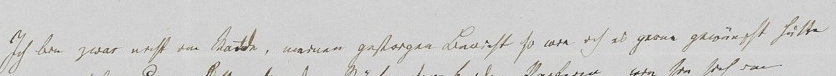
Ich bin zwar nicht im Stande, meinen gestrigen Bericht so wie ich es gerne gewünscht hätte
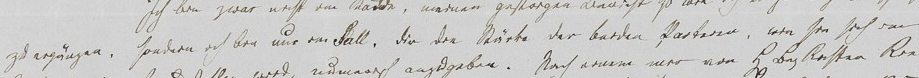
zu ergänzen, sondern ich bin nur im Fall, dir die Stärke der beiden Parteien, wie sie sich im
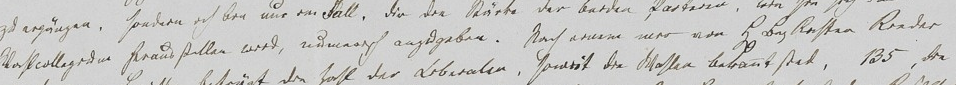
Wahlcollegium herausstellen wird, numerisch anzugeben. Nach einem mir von Herrn Bez.Richter Rieder
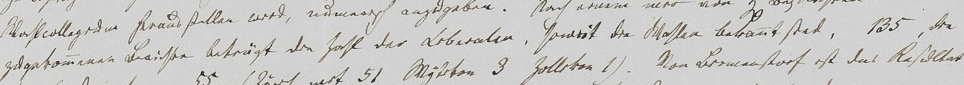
zugekommenen Berichte beträgt die Zahl der Liberalen, soweit die Wahlen bekannt sind, 135, die
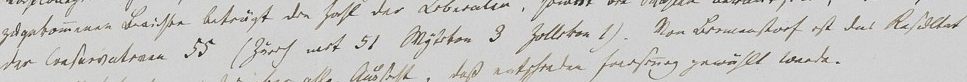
der Conservativen 55 (Zürich mit 51 Wytikon 3 Zollikon 1). Von Birmenstorf ist das Resultat
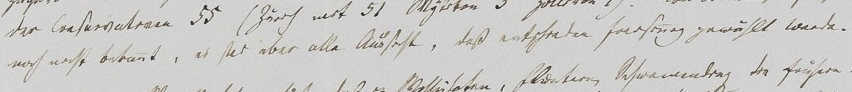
noch nicht bekannt, es sei aber alle Aussicht, daß entschieden freisinnig gewählt werde.
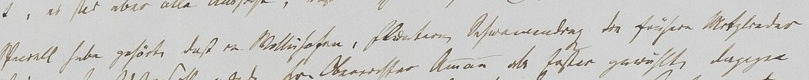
Speciell habe gehört, daß in Wollishofen, Fluntern, Schwamendingen die frühern Mitglieder
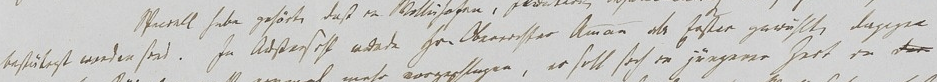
bestätigt worden sei. In Außersihl wurde Hr. Oberrichter Ammann als Erster gewählt, dagegen
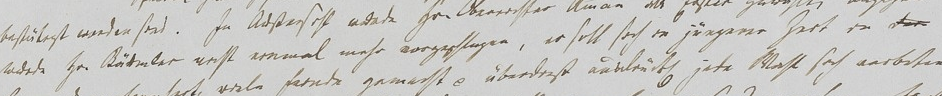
wurde Hr. Bäumler nicht einmal mehr vorgeschlagen, er soll sich in jüngerer Zeit in den
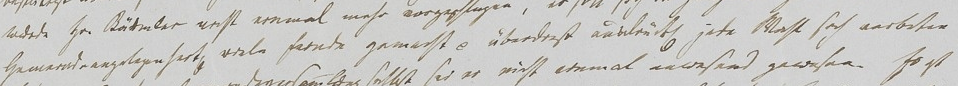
Gemeindeangelegenheiten viele Feinde gemacht & überdieß ausdrücklich jede Wahl sich verbeten
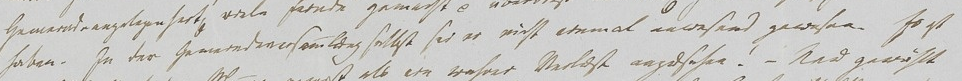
haben. In der Gemeindeversammlung selbst sei er nicht einmal anwesend gewesen. So ist
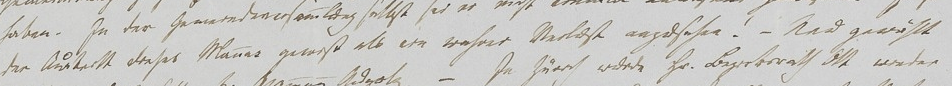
der Austritt dieses Mannes gewiß als ein wahrer Verlust anzusehen! – Und gewählt
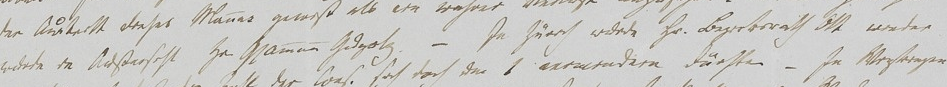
wurde in Außersihl Hr. GAmmann v.: Gugolz. – In Zürich wurde Hr. Bezirksrath Ott wieder
